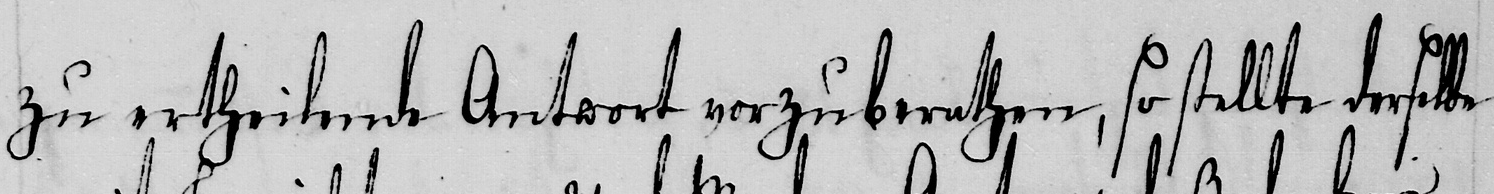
zu ertheilende Antwort vorzuberathen, so stellte ders¬
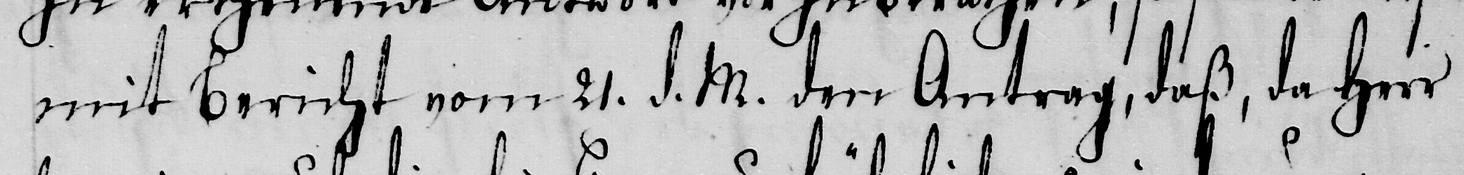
mit Bericht vom 21. d. M. den Antrag, daß da Herr
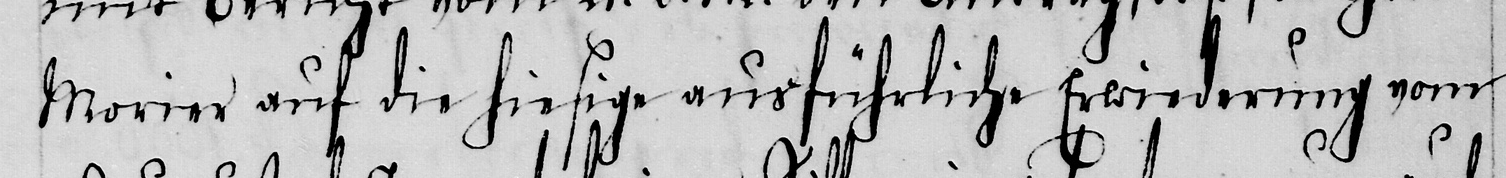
Morier auf die hiesige ausführliche Erwiederung vom
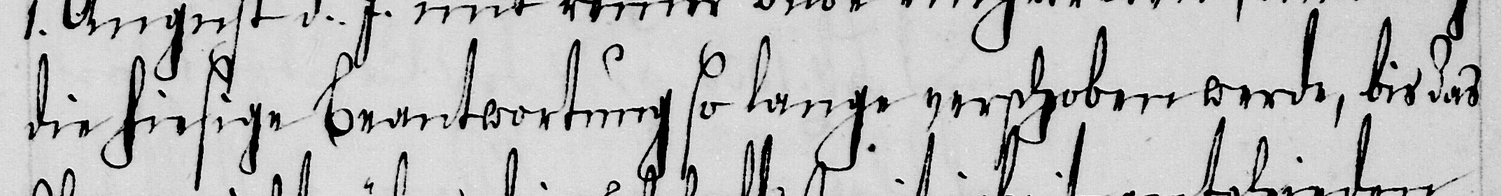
die hiesige Beantwortung so lange verschoben werde, bis das
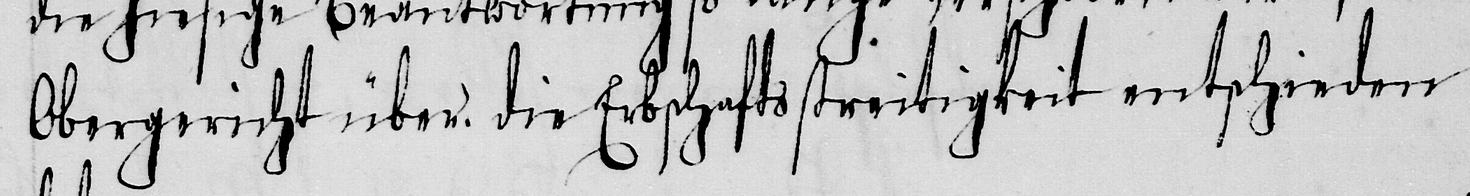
Obergericht über die Erbsstreitigkeit entschieden
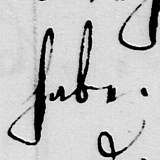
habe.
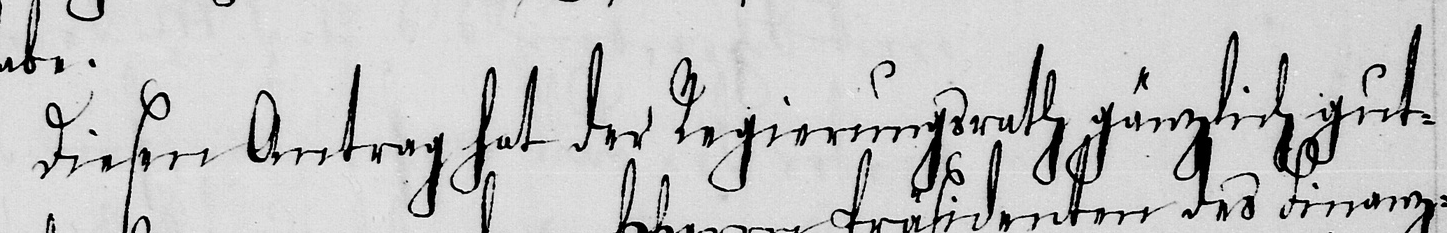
Diesen Antrag hat der Regierungsrath gänzlich gut¬
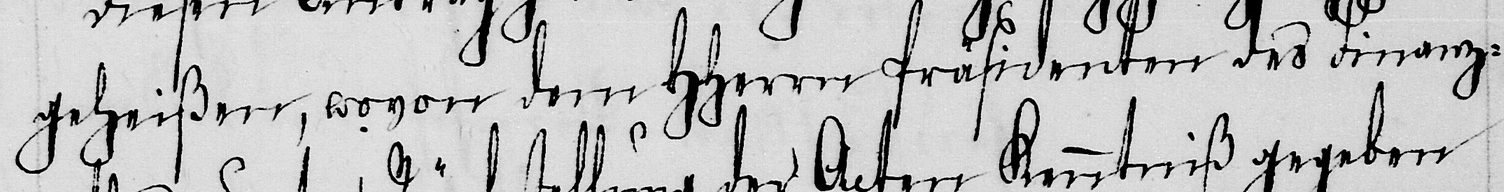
geheißen, wovon dem HHerrn Präsidenten des Finanz¬
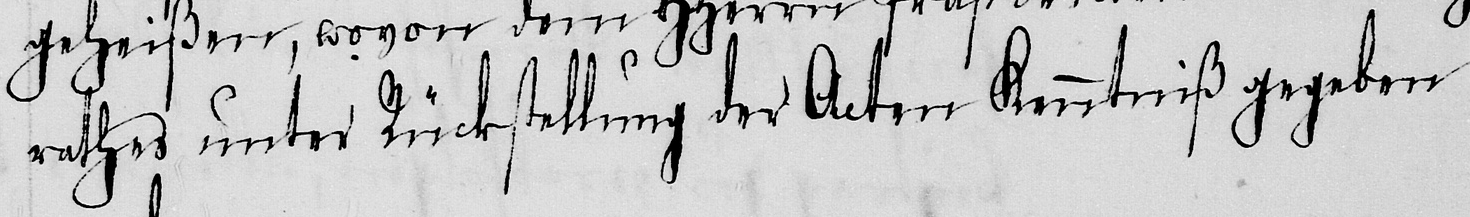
rathes unter Rückstellung der Acten Kenntniß gegeben
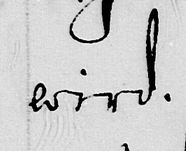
wird.
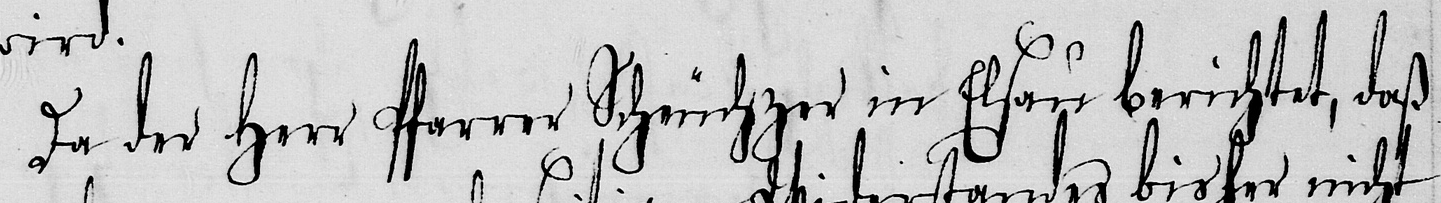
Da der Herr Pfarrer Scheuchzer in Elsau berichtet, daß
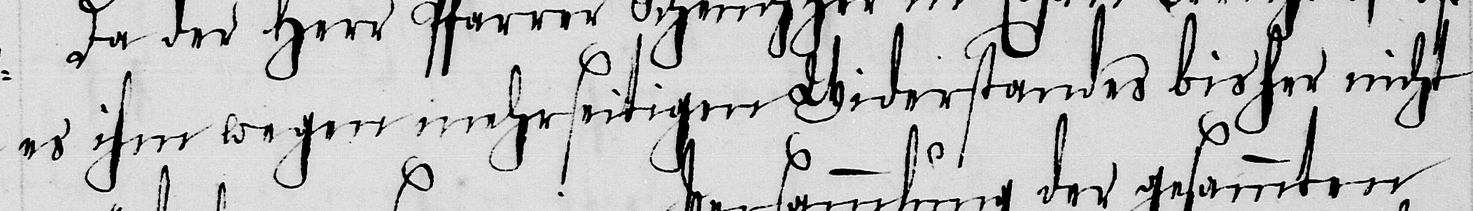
es ihm wegen mehrseitigen Widerstandes bisher nicht
